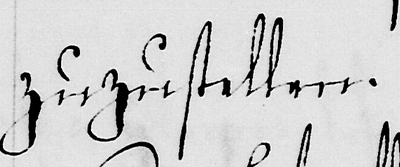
zuzustellen.
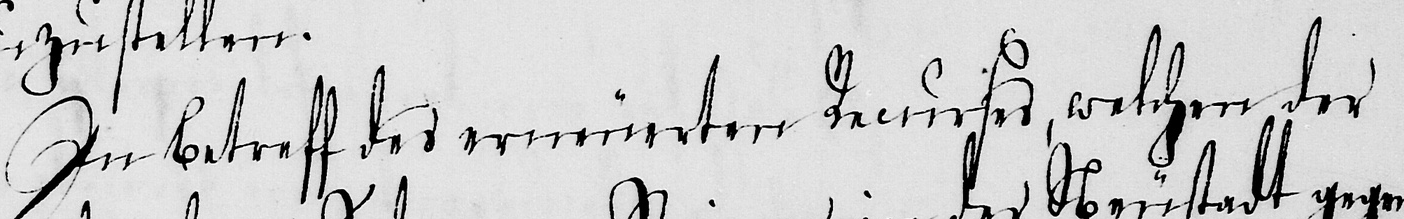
In Betreff des erneuerten Recurses, welchen der
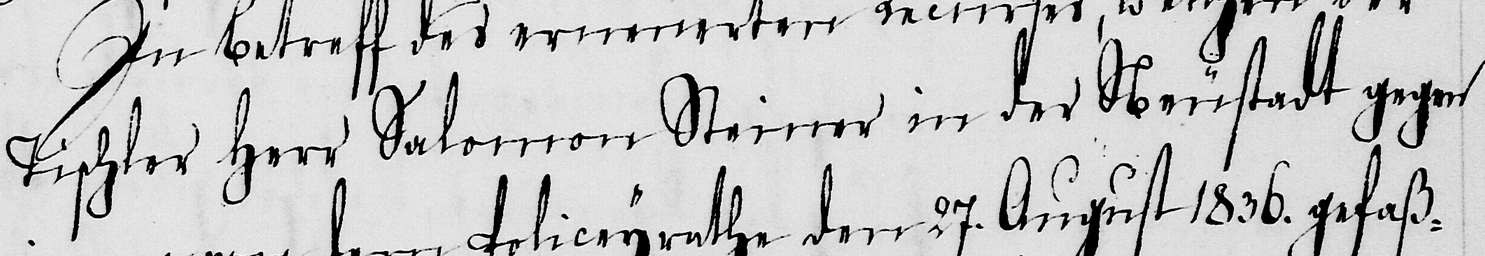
Tischler Herr Salomon Steiner in der Neustadt gegen
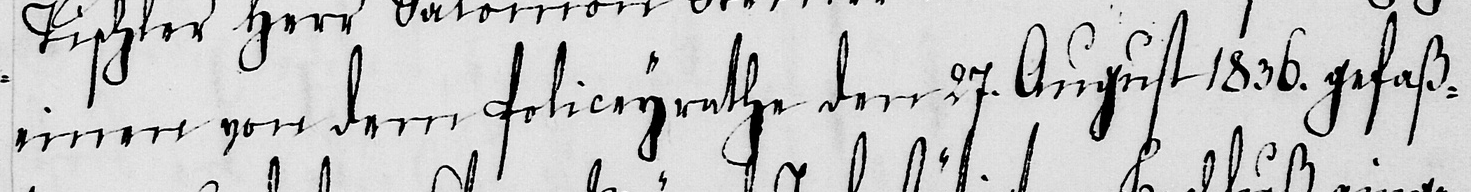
einen von dem Policeyrathe den 27. August 1836. gefaß¬
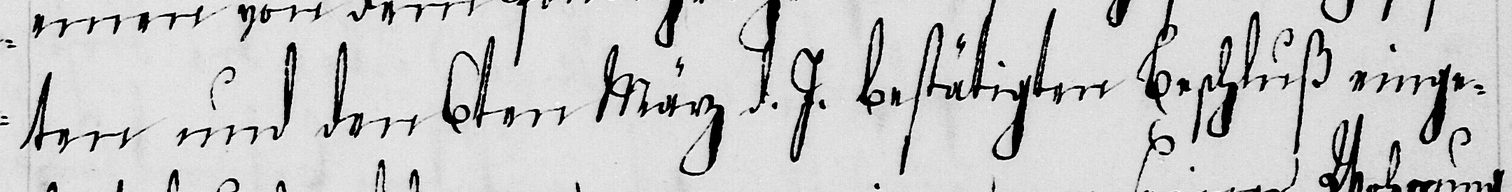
ten und den 6ten März d. J. bestätigten Beschluß einge¬
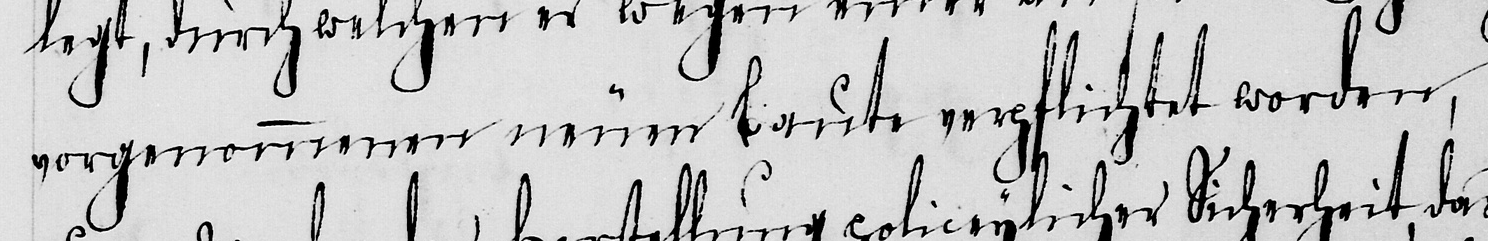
vorgenommenen neuen Baute verpflichtet worden,
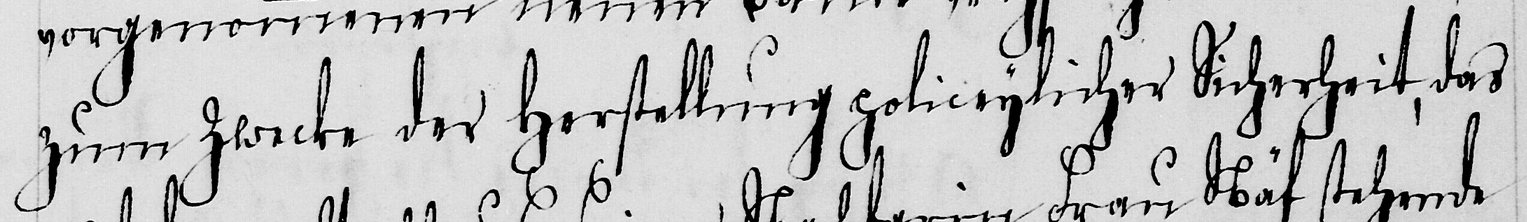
zum Zwecke der Herstellung policeylicher Sicherheit, das
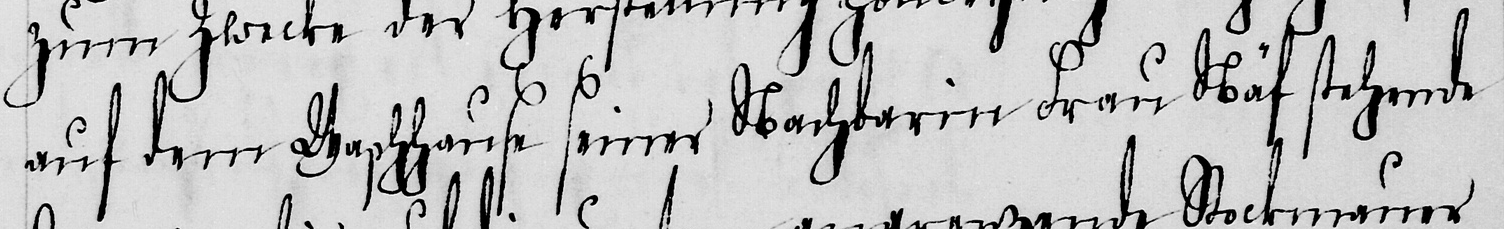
auf dem Waschhause seiner Nachbarin Frau Näf stehende
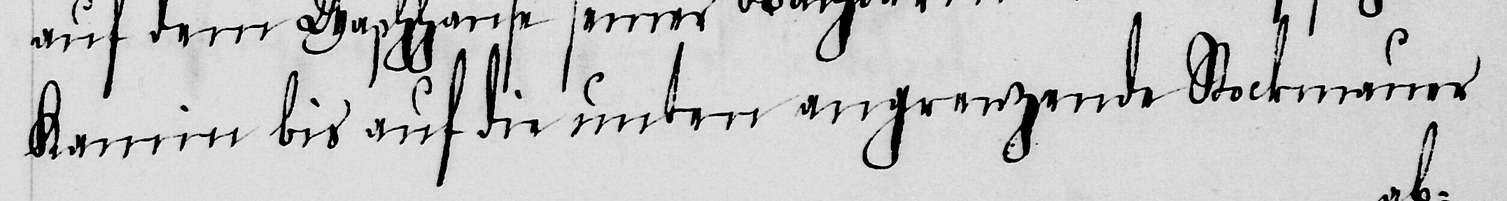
Kamin bis auf die unten angrenzende Stockmauer
